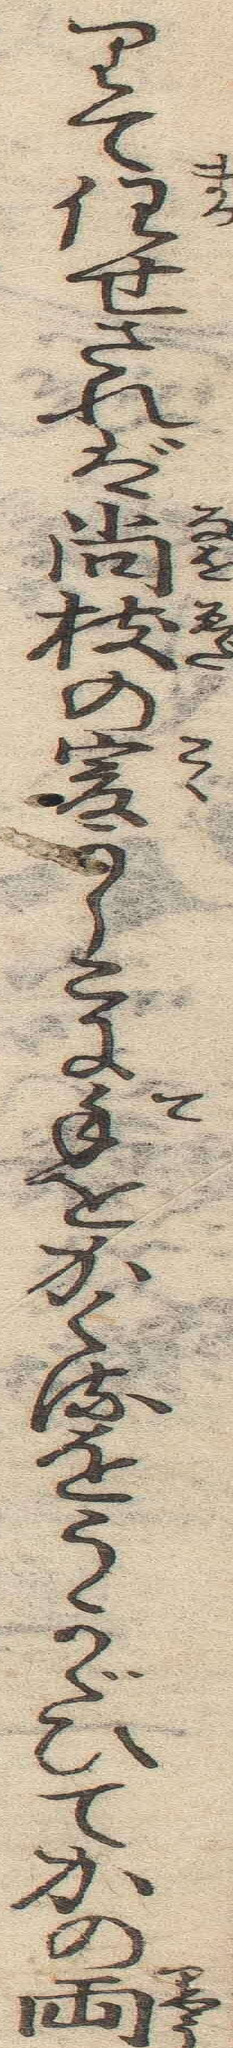りて任せされば尚枝の爰かしこに手をかくるをうかゞひてかの両
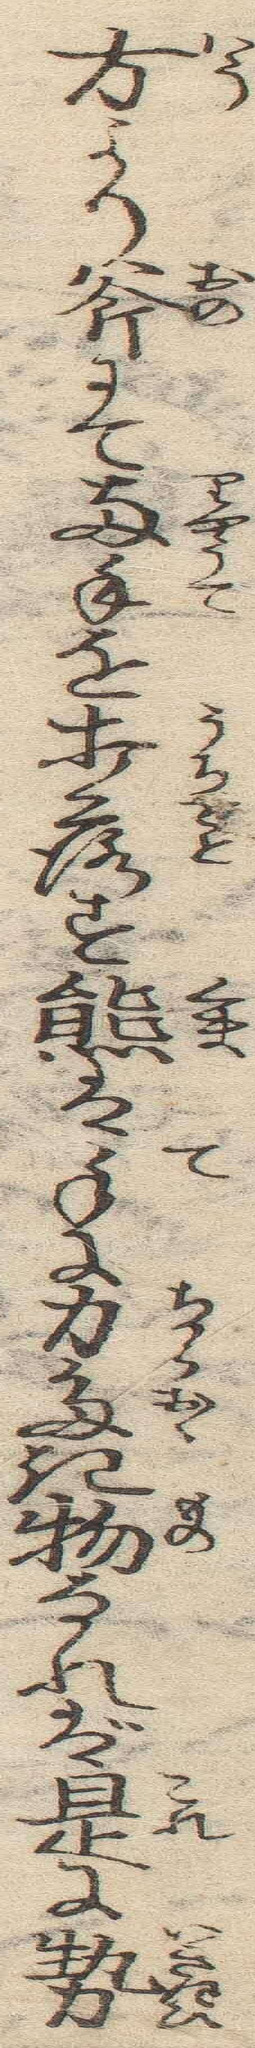方より斧にて両手を打落す熊は手に力多き物なれば是に勢
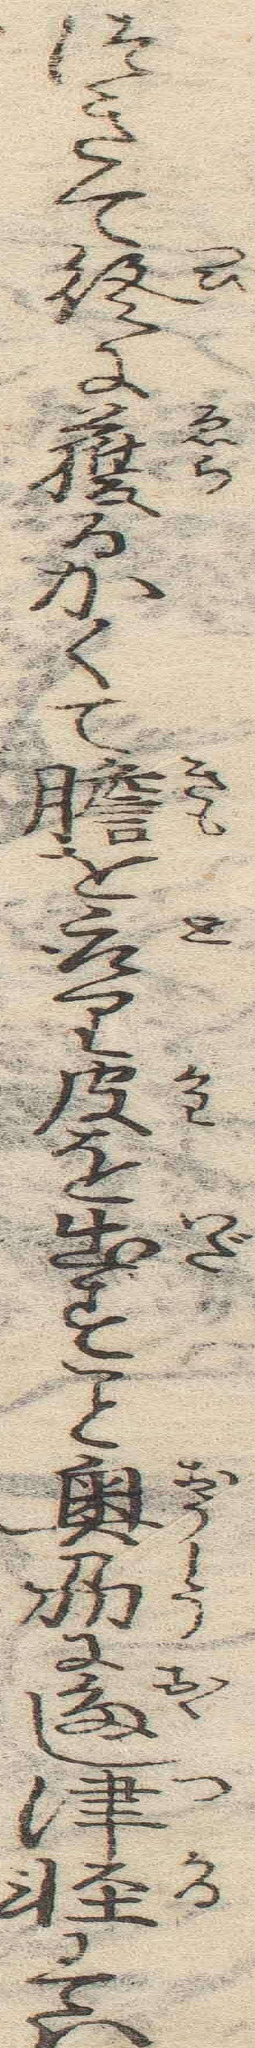つきて終に獲るかくて膽を取り皮を出すこと奥州に多し津軽にては
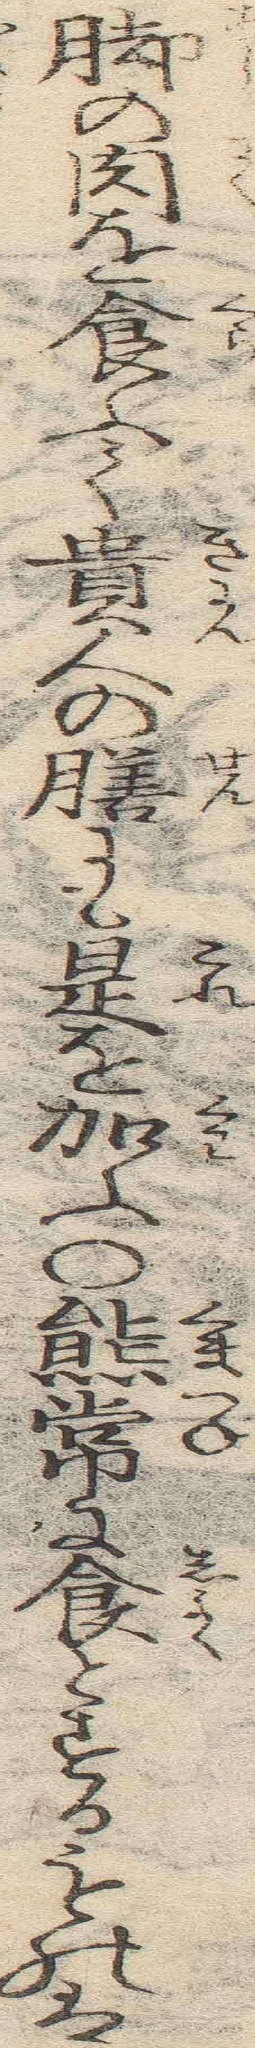脚の肉を食ふて貴人の膳にも是を加ふ○熊常に食とするものは
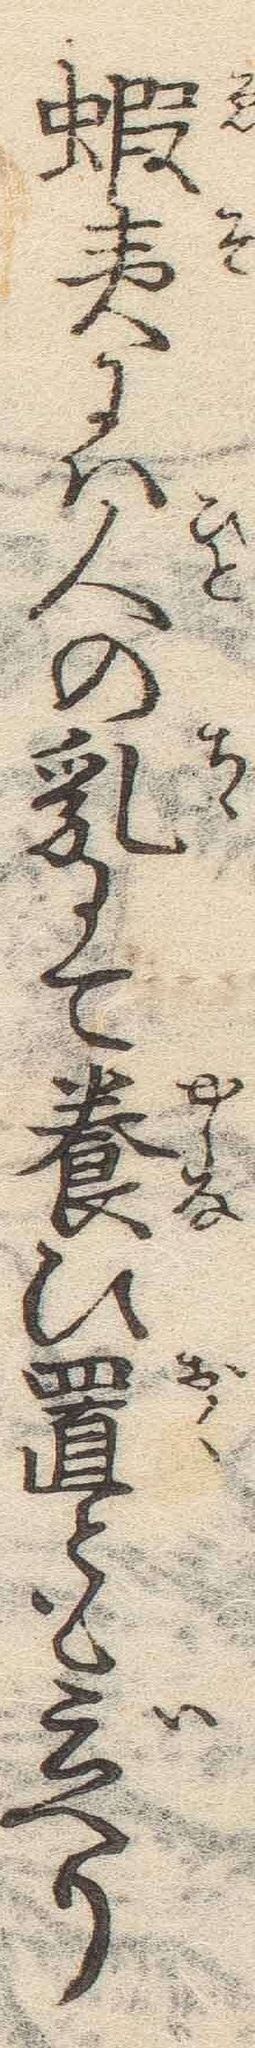蝦夷には人の乳にて養ひ置とも云へり
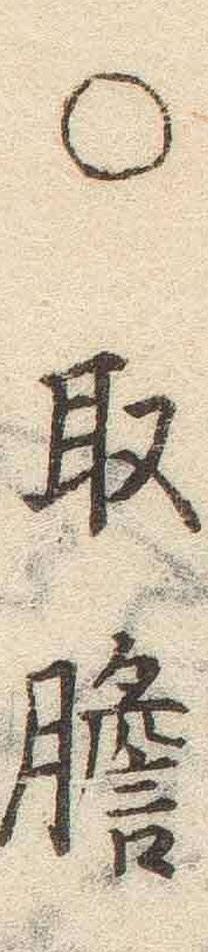○取膽
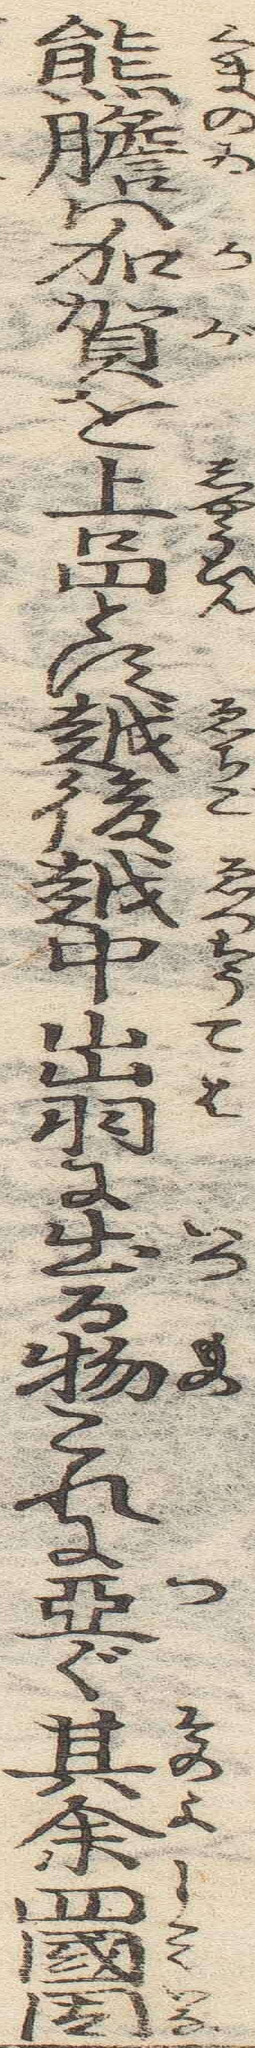熊膽は加賀を上品とす越後越中出羽に出る物これに亜ぐ其余四国因
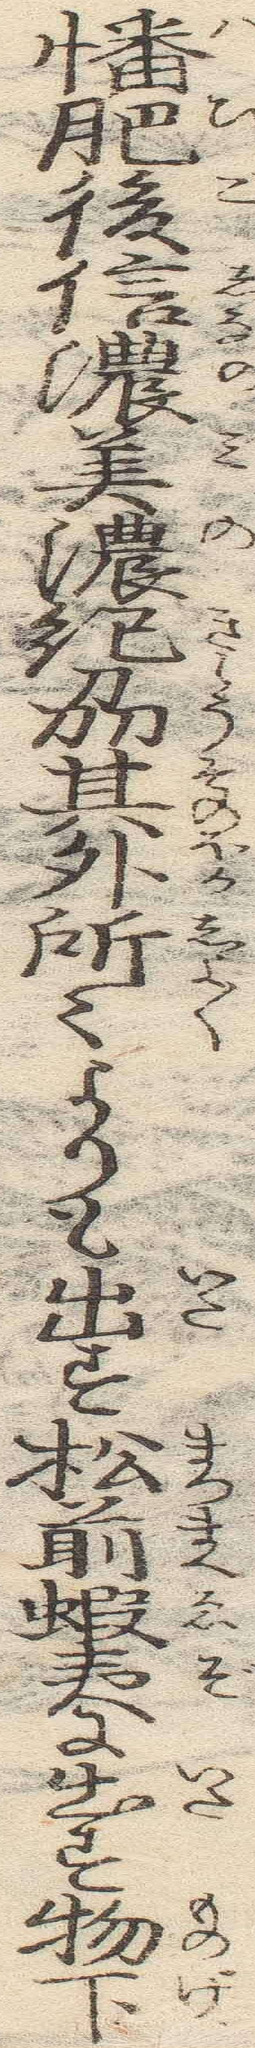幡肥後信濃美濃紀州其外所々よりも出す松前蝦夷に出す物下
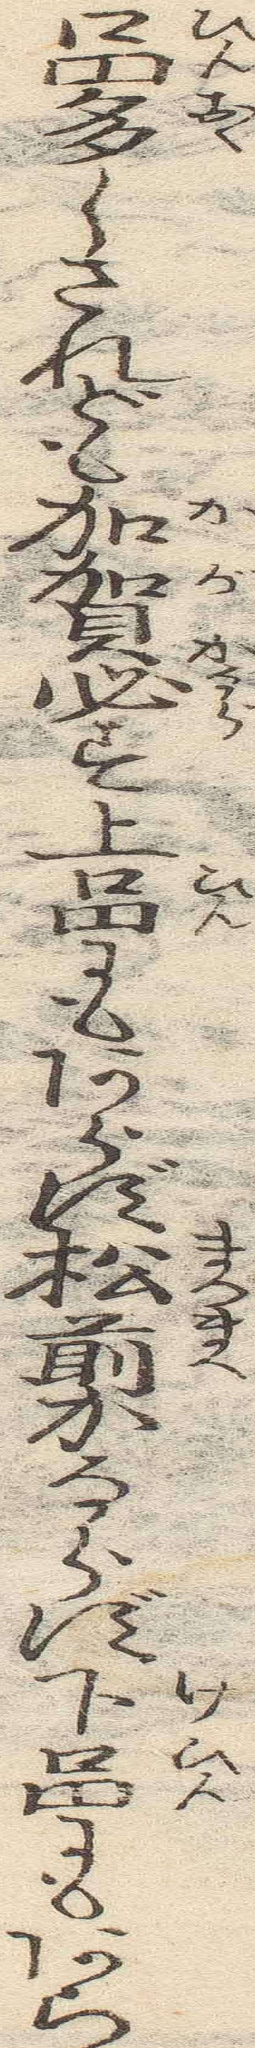品多しされども加賀必す上品にもあらず松前かならず下品にもあら
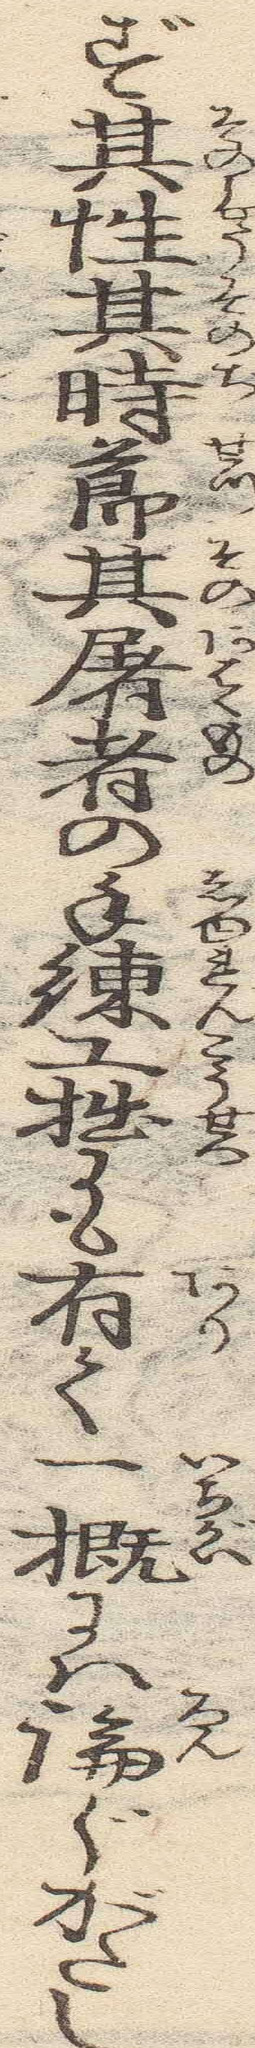ず其性其時節其屠者の手練工拙にも有て一概には論じがたし
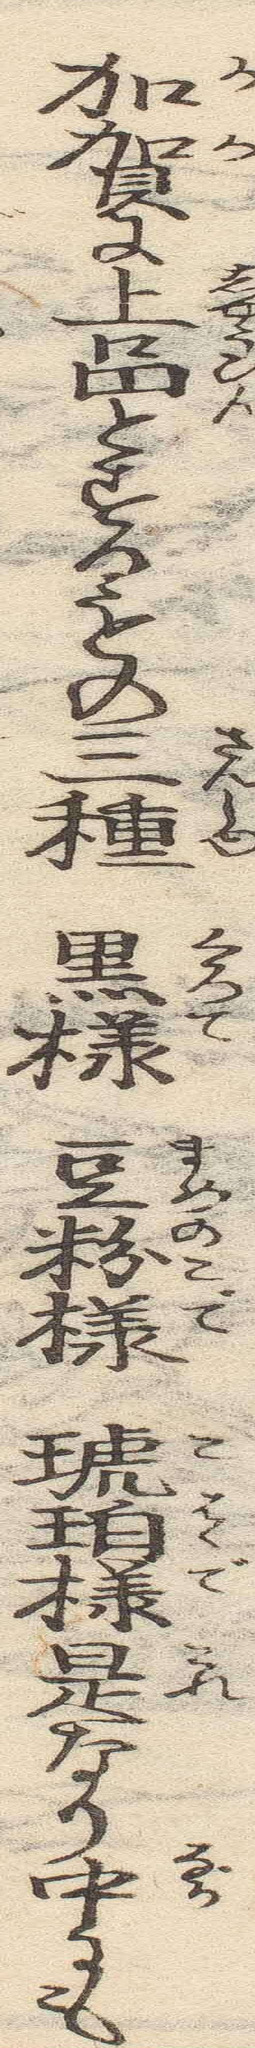加賀に上品とするもの三種黒様豆粉様琥珀様是なり中にも
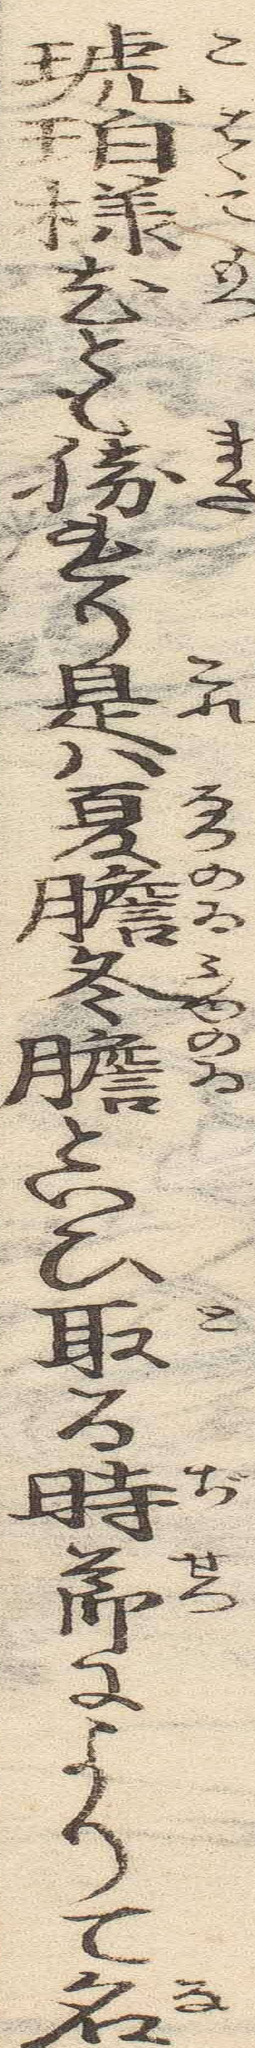琥珀様尤とも勝れり是は夏膽冬膽といひ取る時節によりて名
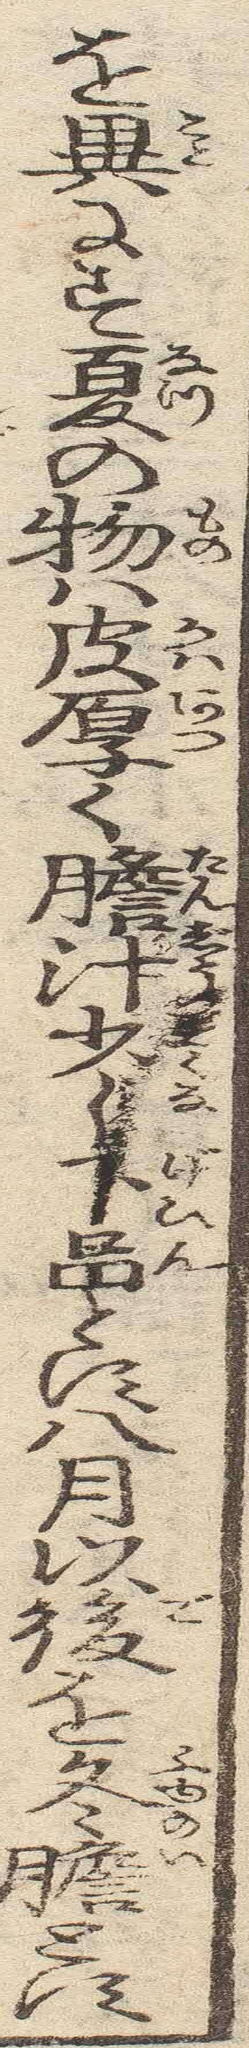を異にす夏の物は皮厚く膽汁少し下品とす八月以後を冬膽とす
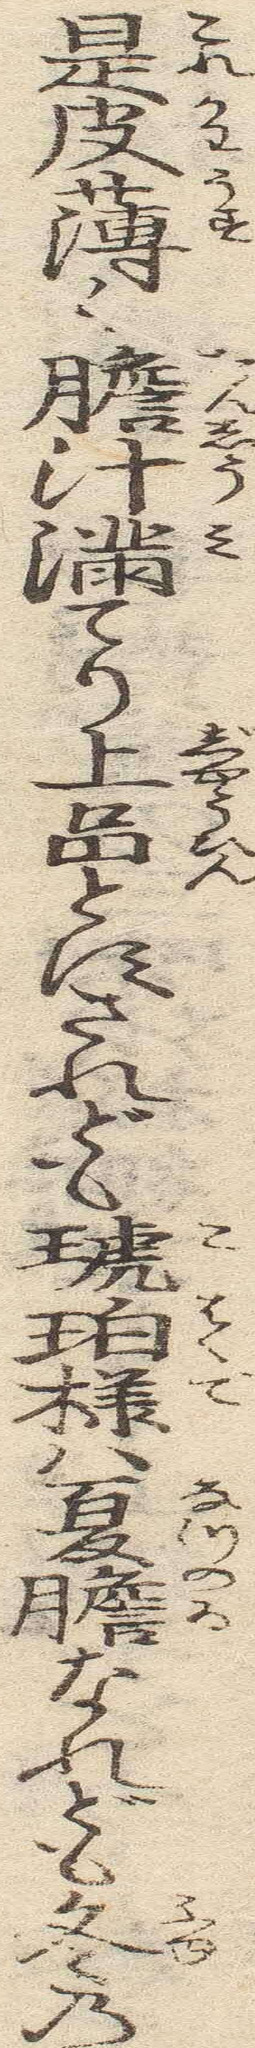是皮薄く膽汁満てり上品とすされども琥珀様は夏膽なれども冬の
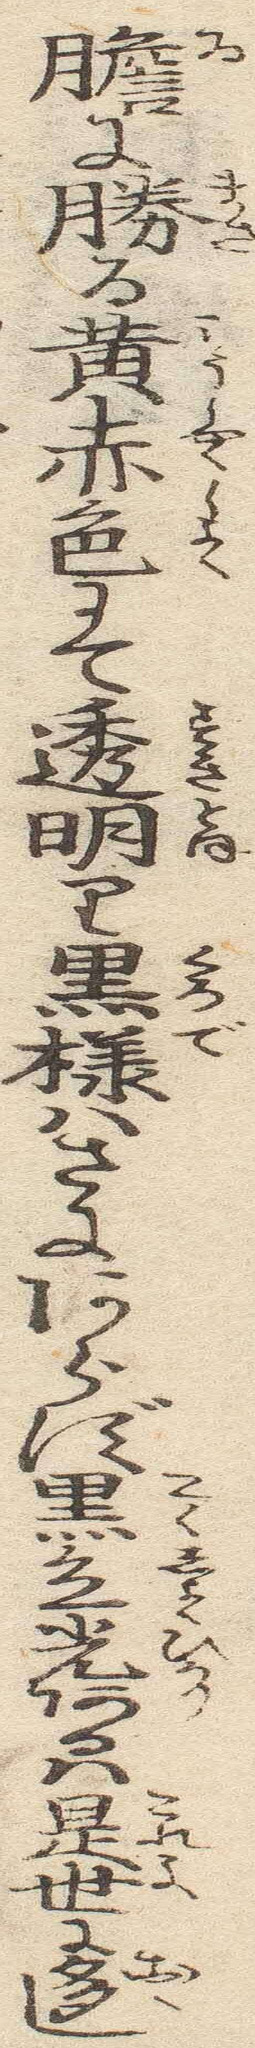膽に勝る黄赤色にて透明り黒様はさにあらず黒色光あるは是世に多し
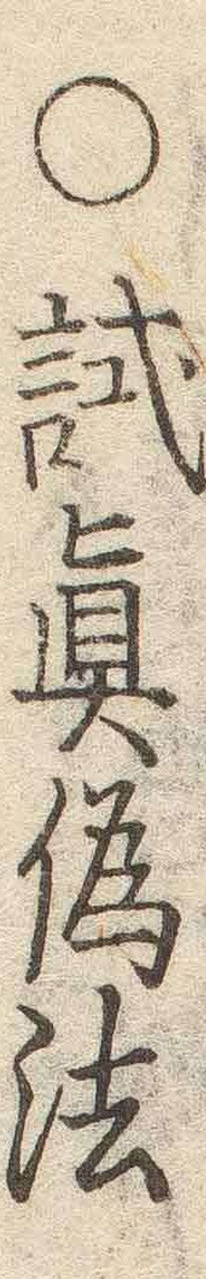○試真偽法
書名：日本山海名産図会
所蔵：東京学芸大学附属図書館 国文学研究資料館
